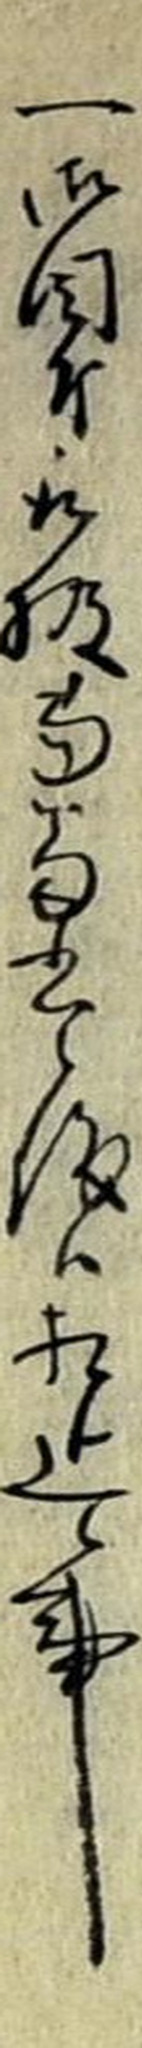一御目付取扱当番書之儀ハ相止候事
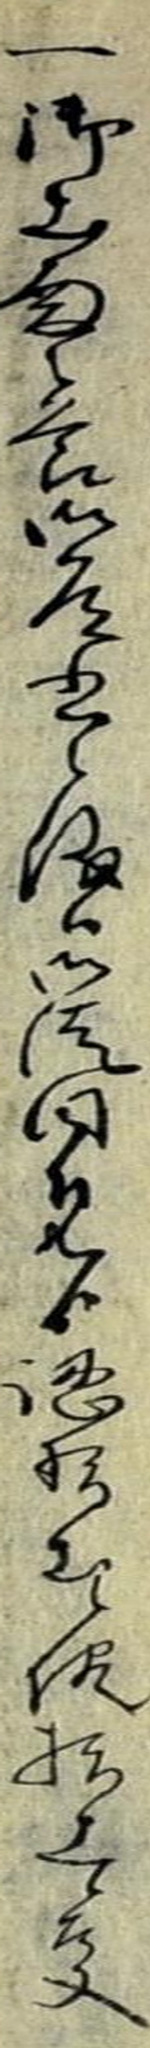一御出殿之節御道書之儀ハ御徒目付共ゟ認指出候儘指上候事
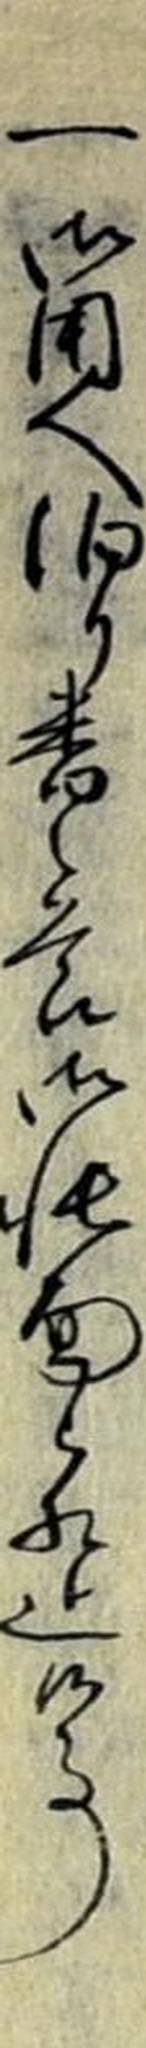一御用人泊り番之節御帳面被相止候事
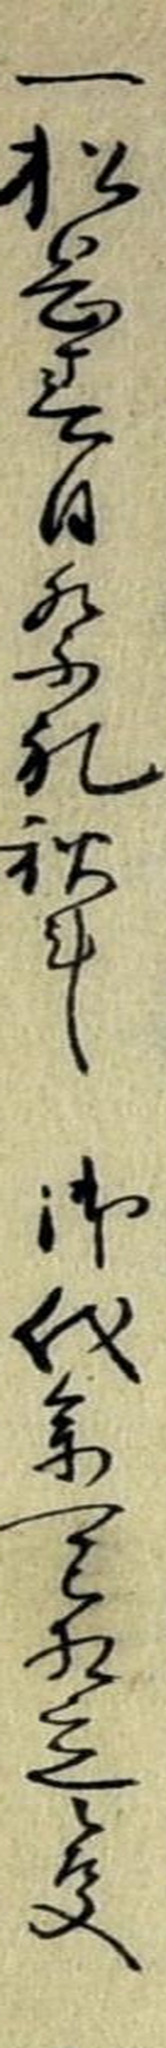一松岡春日祭礼秋斗御代参可被相立候事
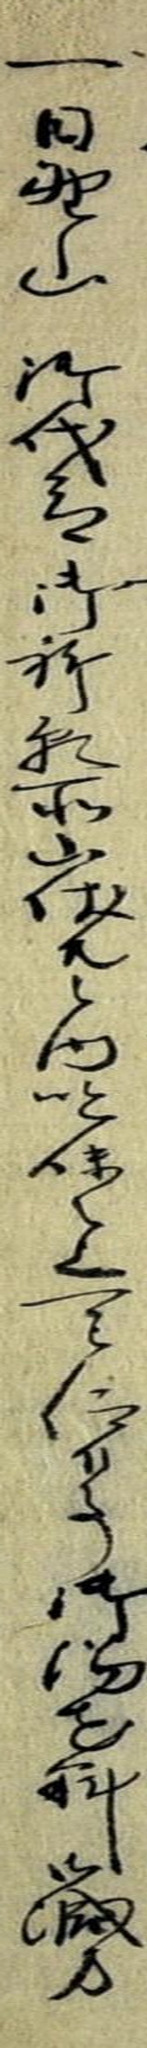一日野山御代参御祈願所山伏共之内吟味之上可被仰付事御湯花領料御減方
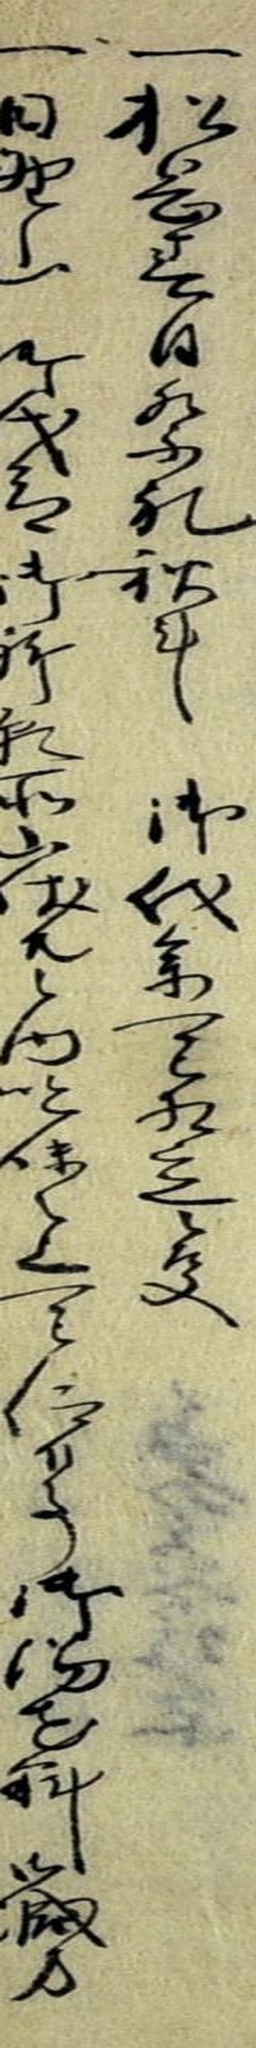一日野山御代参御祈願所山伏共之内吟味之上可被仰付事御湯花領料御減方
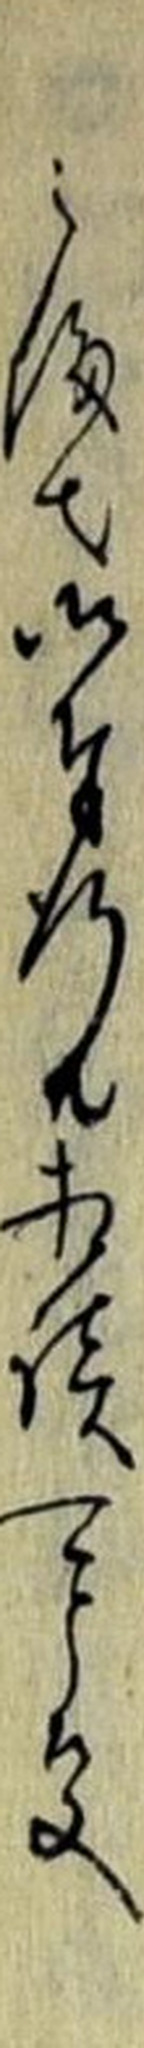之儀者御奉行共相談可申事
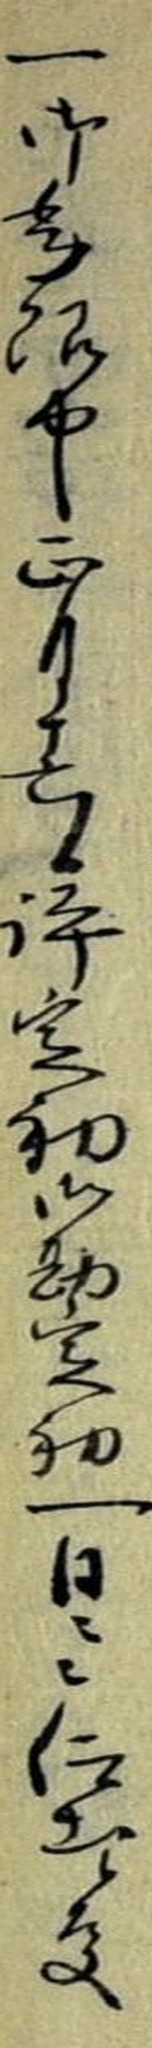一御年限中正月十六日評定初御勘定初一日ニ被仰出候事
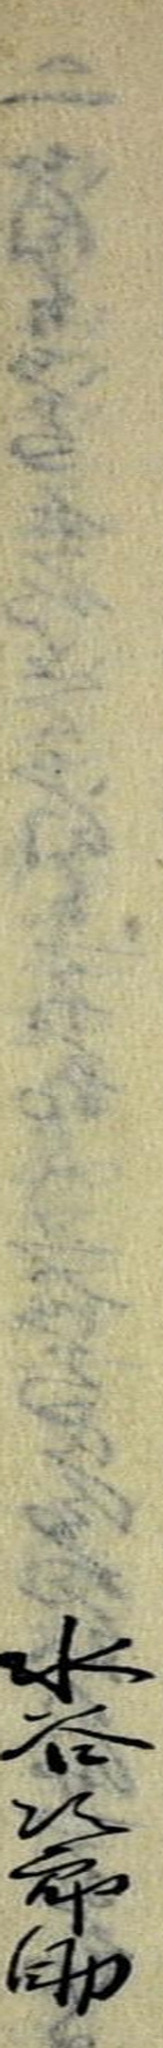水谷次郎助
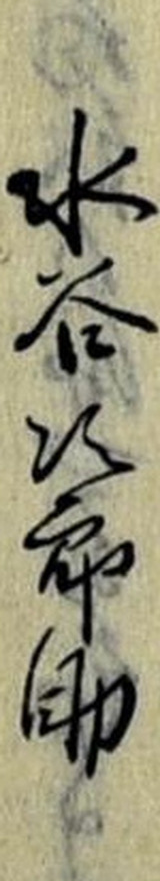水谷次郎助
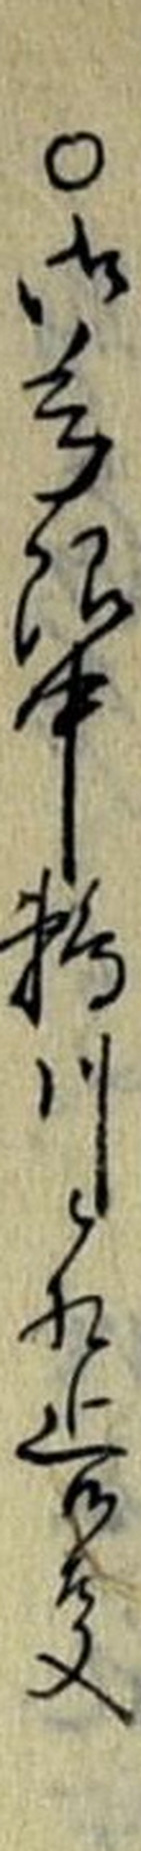〇御年限中鵜川被相止候事
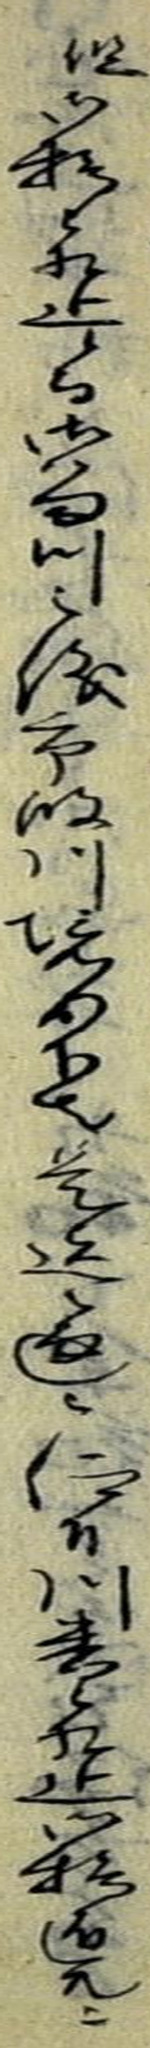但御鵜被相止候ニ付御留川之儀市波川境ゟ下者是迄之通被仰付川番被相止御鵜匠共ニ
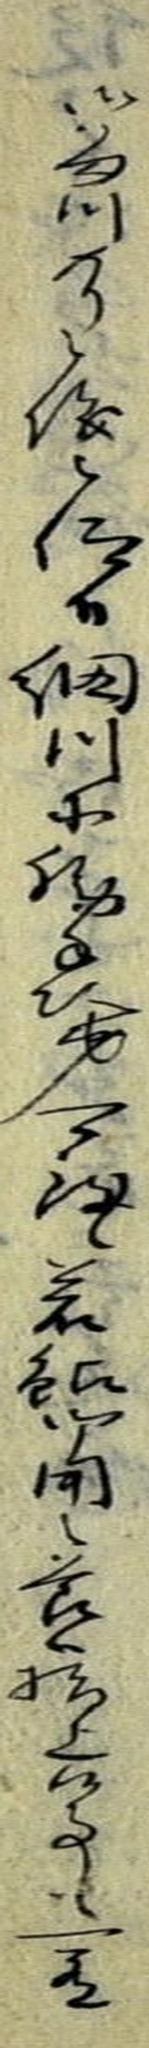御留川〆り之儀被仰付網川等勝手次第可致候若鮎御用之節ハ指上候事も可有
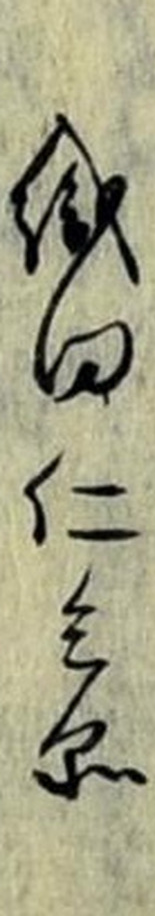織田仁兵衛
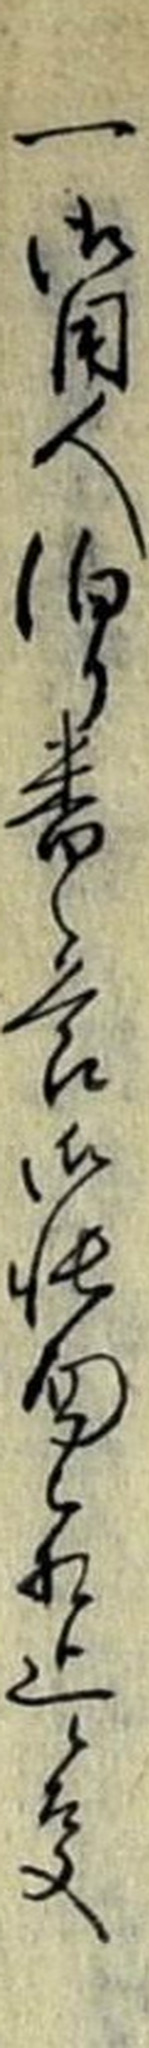一御用人泊り番之節御帳面被相止候事
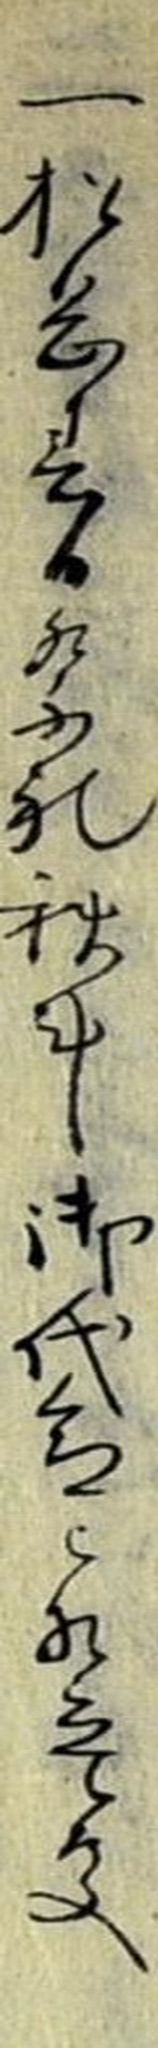一松岡春日祭礼秋斗御代参可被相立候事
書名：命令之部 三
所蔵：福井県文書館 Fukui Prefectural Archives
